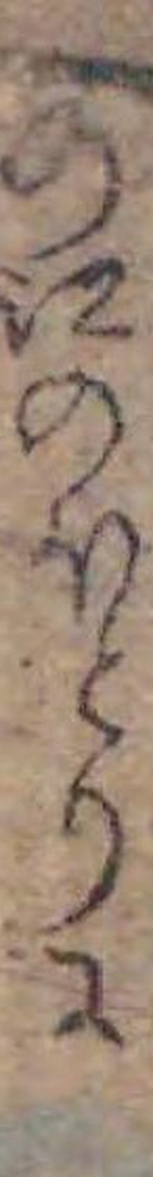の江のほとりに
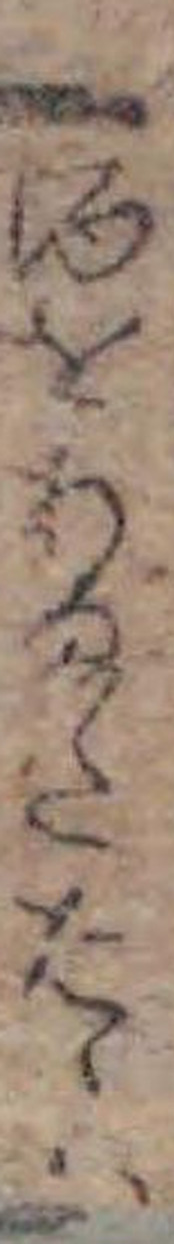酒をあまたたくは
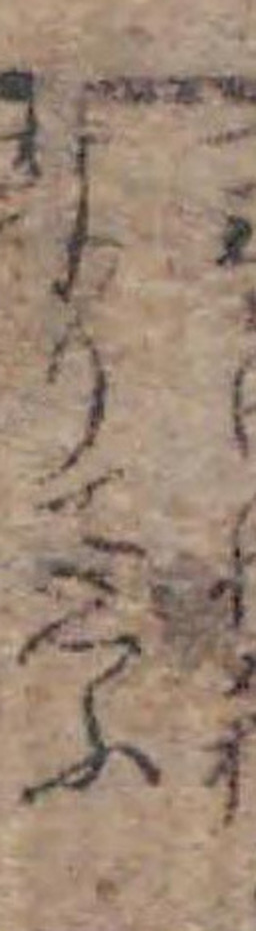来りて思ふ
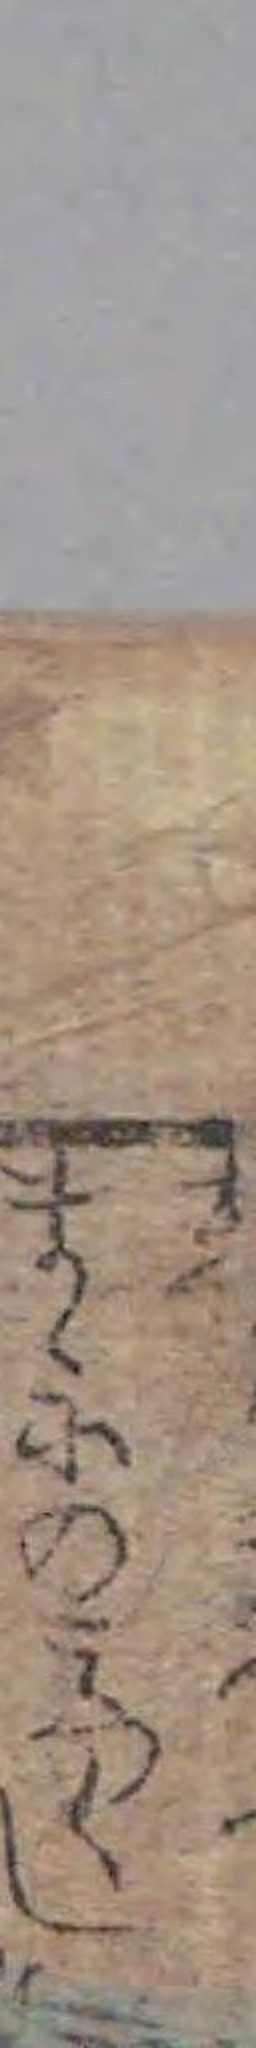まゝにのみつくし
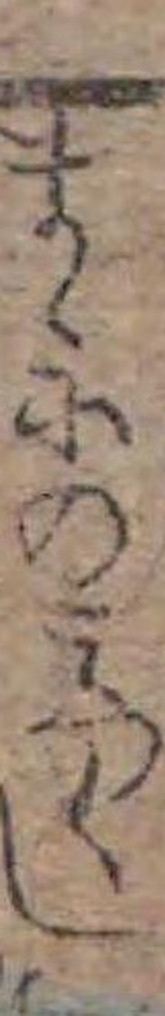まゝにのみつくし
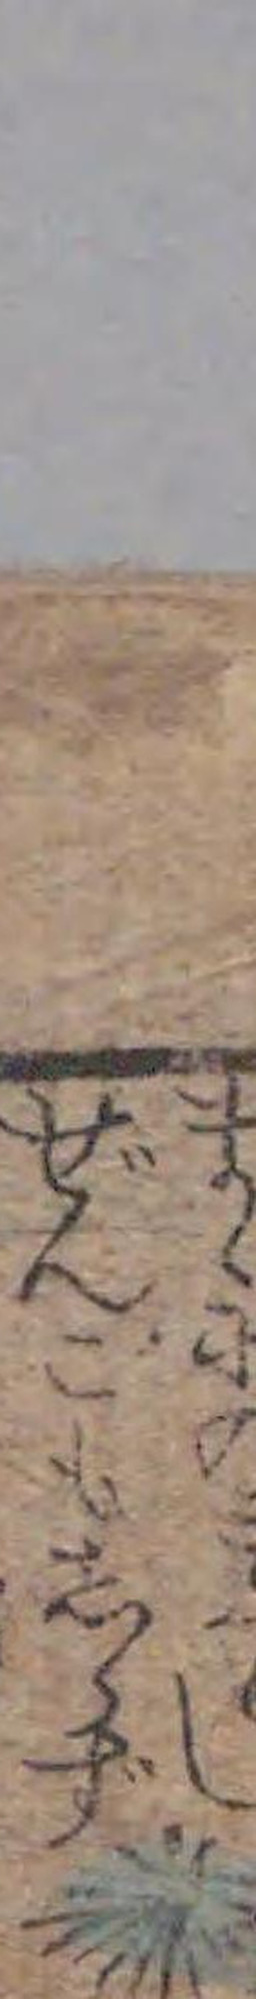ぜんごもしらず
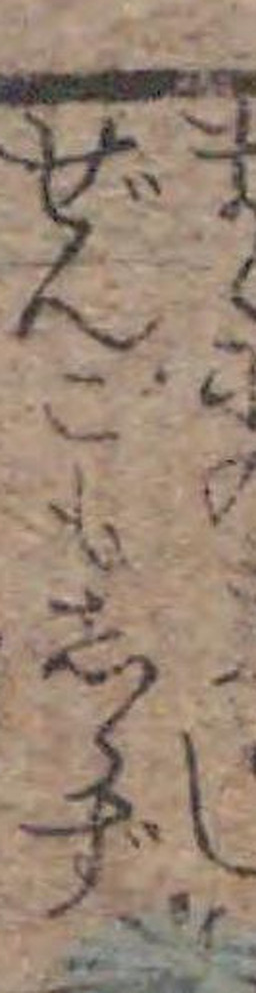ぜんごもしらず
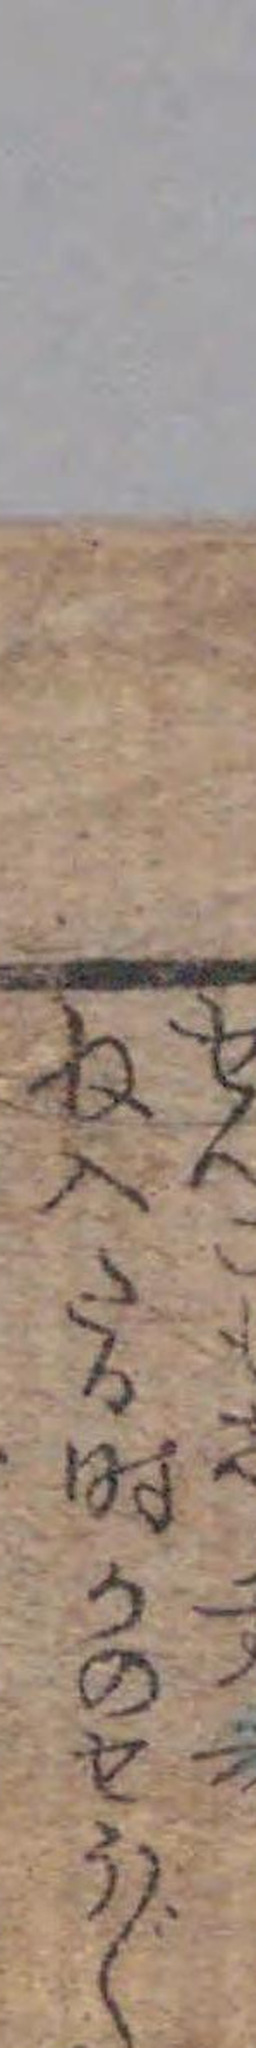ね入たる時かのせう〴〵を
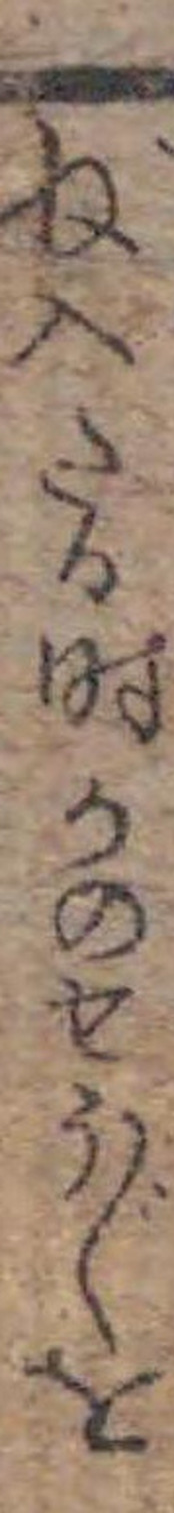ね入たる時かのせう〴〵を
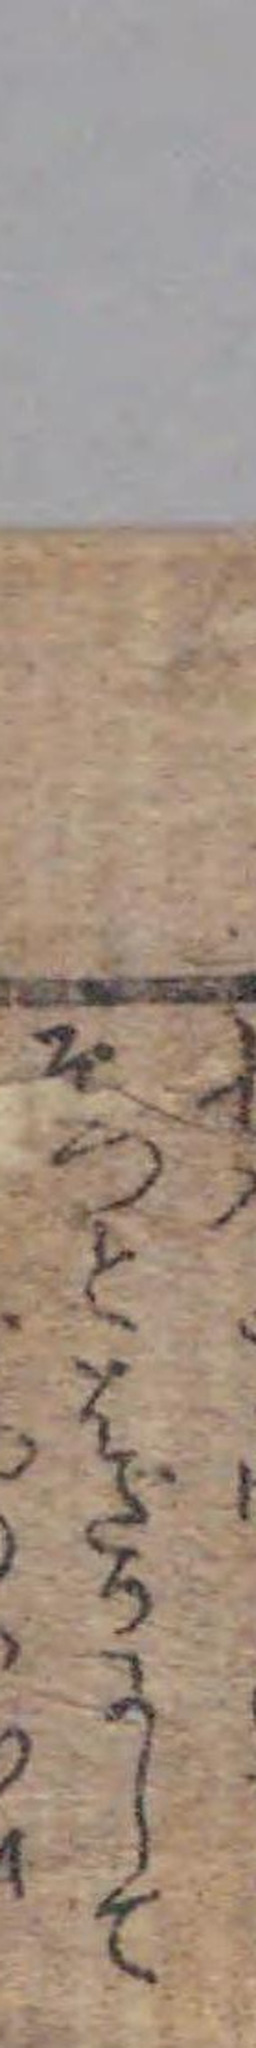そつとはだかにして
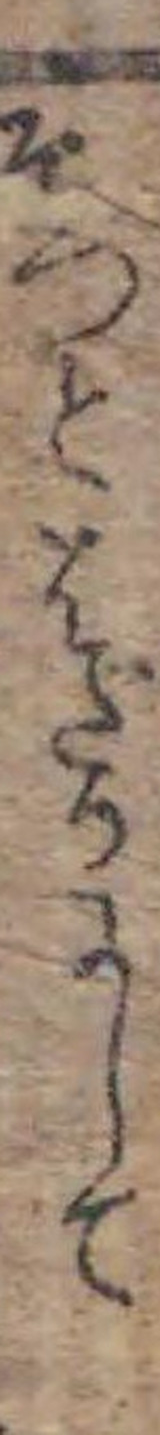そつとはだかにして
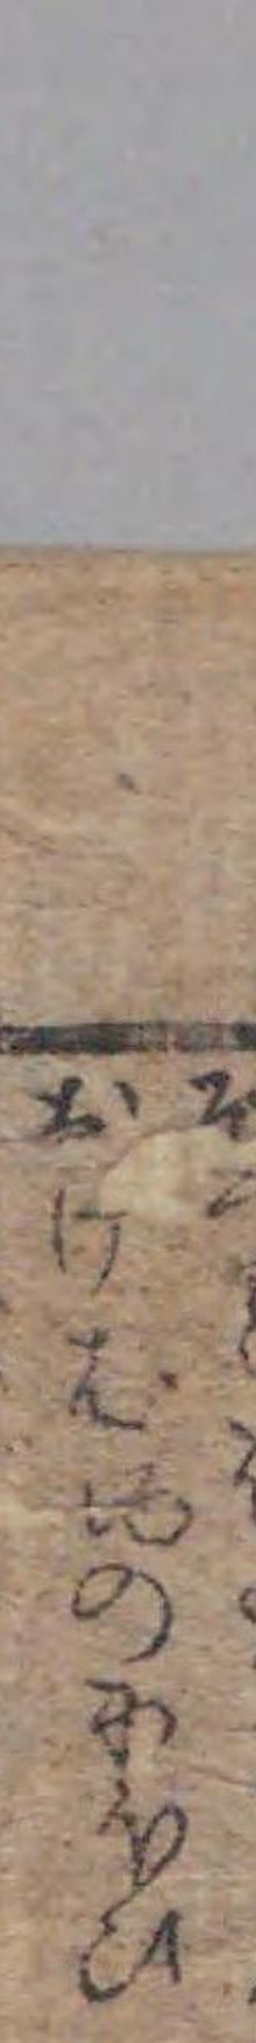おけば酒のにほひ
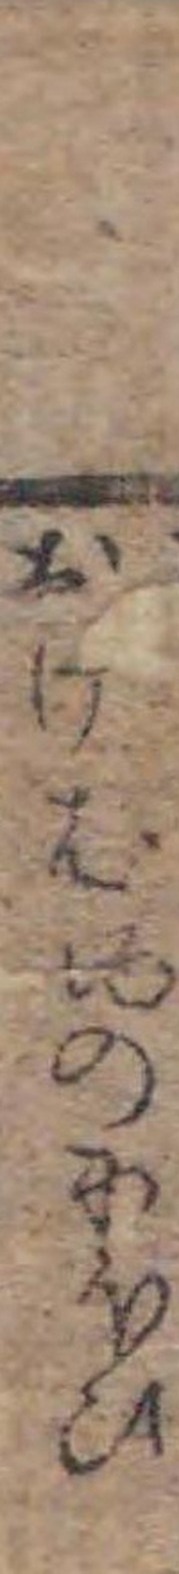おけば酒のにほひ
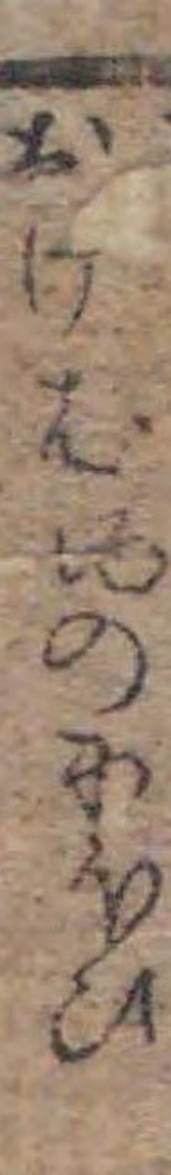おけば酒のにほひ
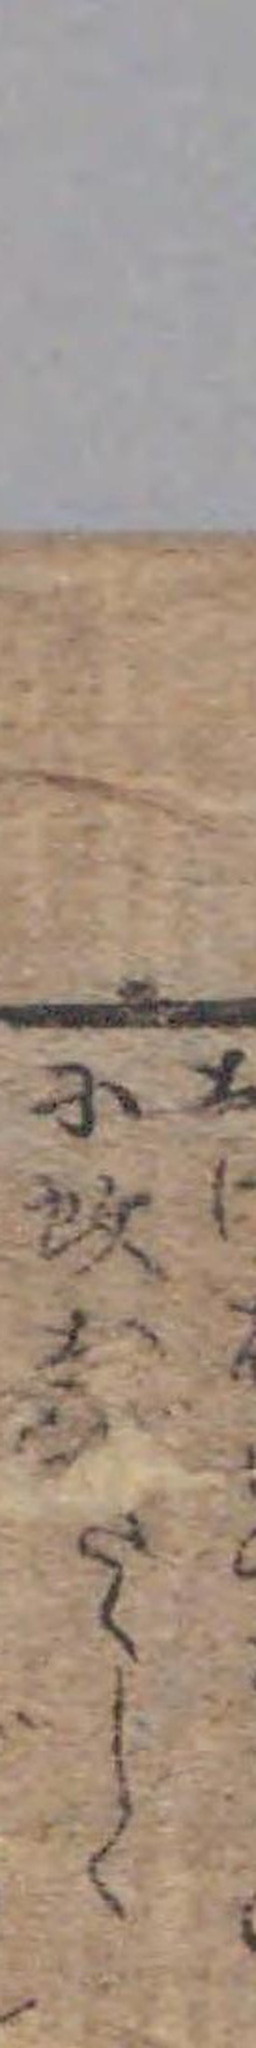に蚊おびたゝしく
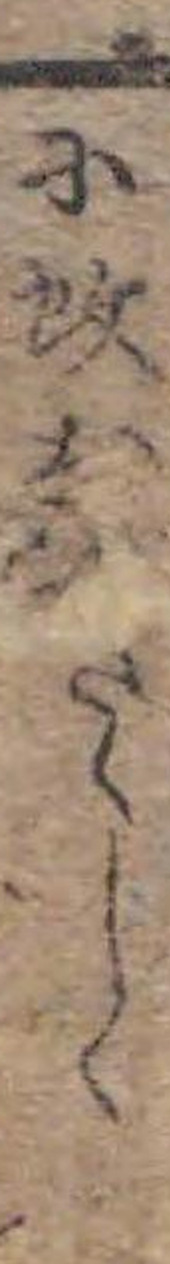に蚊おびたゝしく
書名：虚言八百万八伝 : 3巻
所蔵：国立国会図書館 National Diet Library, JAPAN
